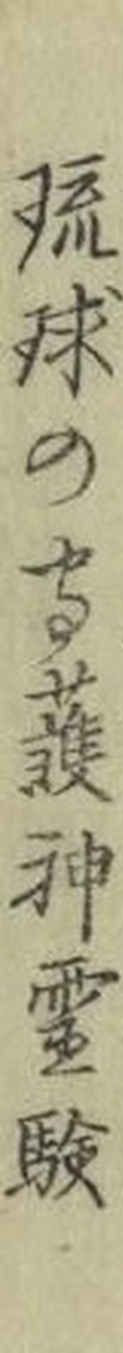琉球の守護神霊験

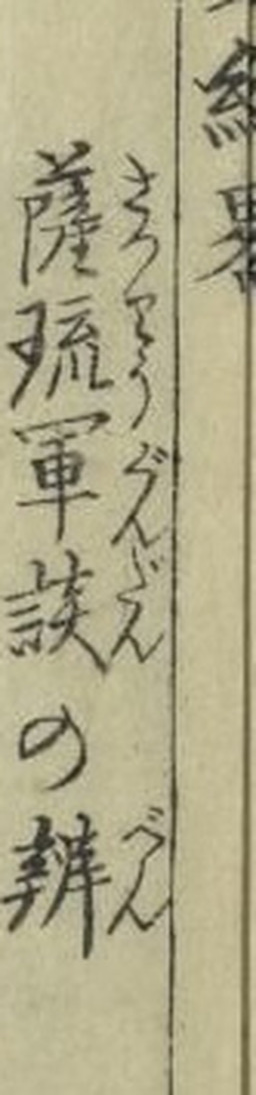薩琉軍談の弁
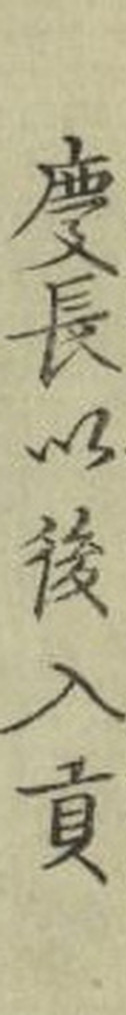慶長以後入貢
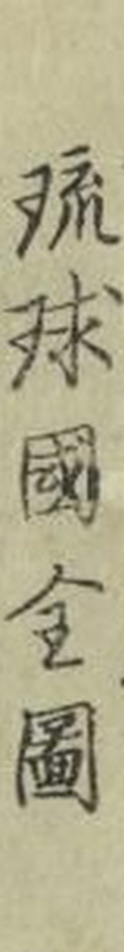琉球国全図
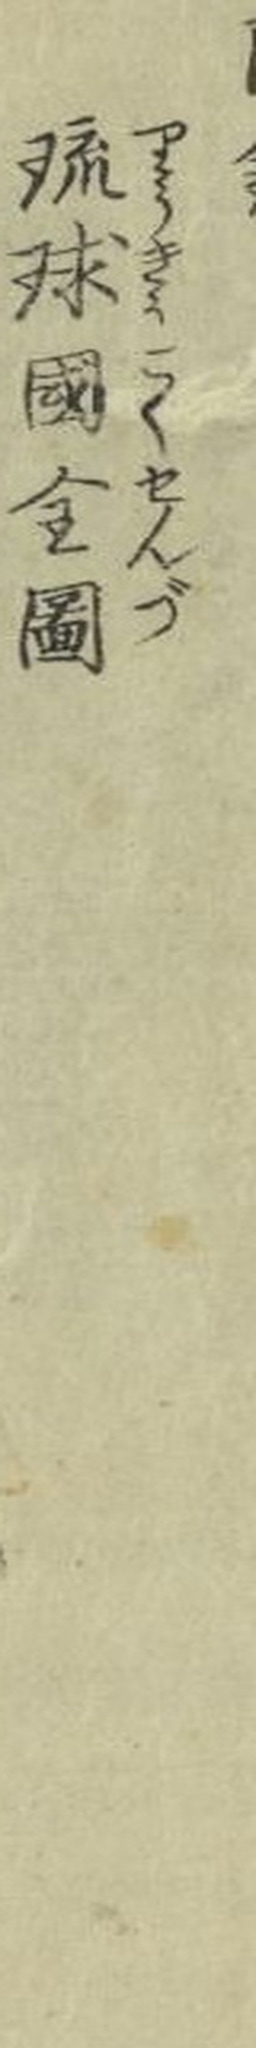琉球国全図
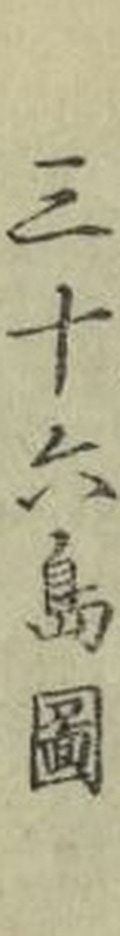三十六島図
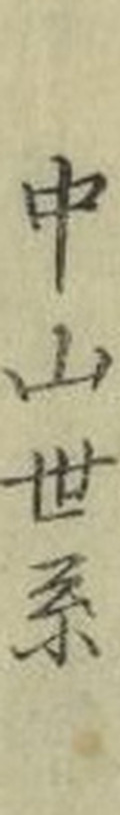中山世系
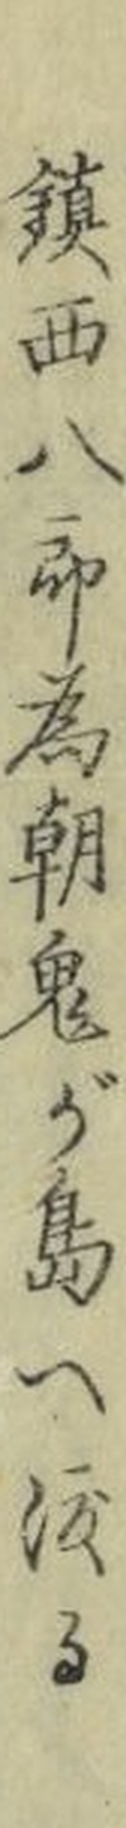鎮西八郎為朝鬼が島へ渡る
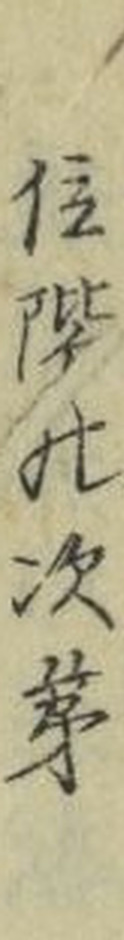位階の次第
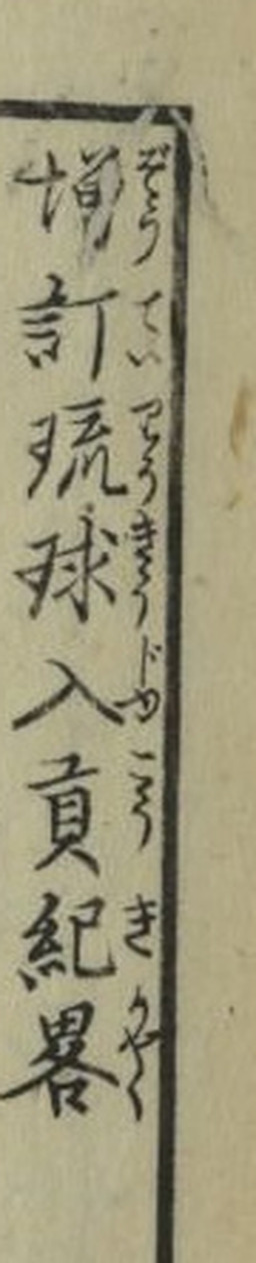増訂琉球入貢紀略
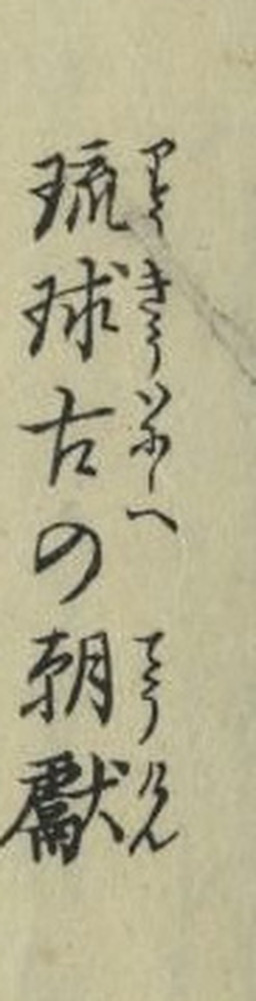琉球古の朝献
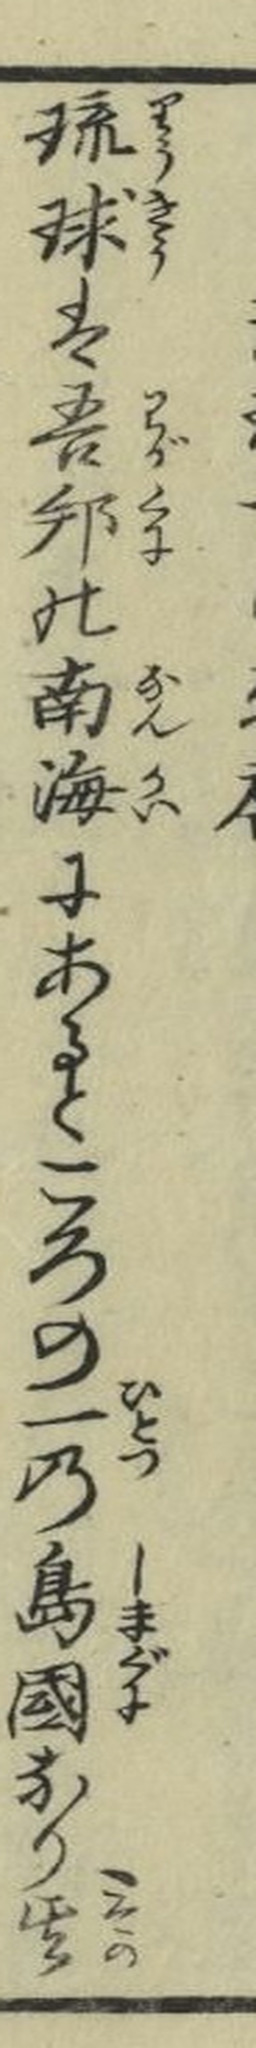琉球は吾邦の南海にあるところの一の島国なり、其
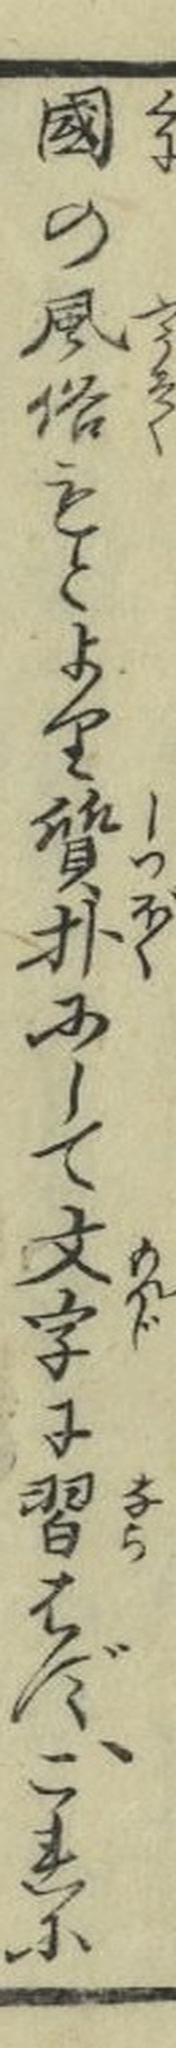国の風俗もとより質朴にして文字に習はず、これに
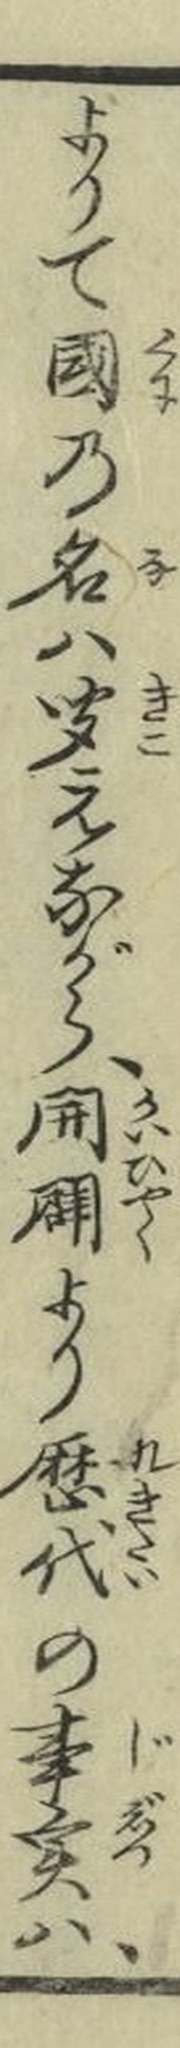よりて国の名は聞えながら、開闢より歴代の事実は、
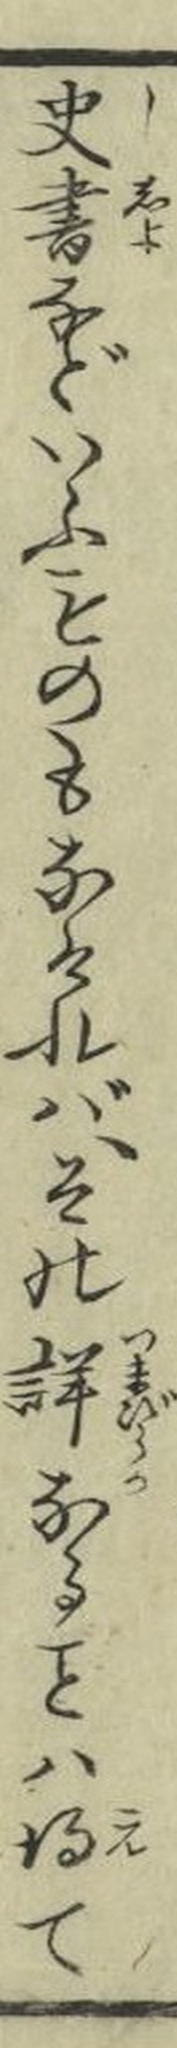史書などいふものもなければ、その詳なることは得て
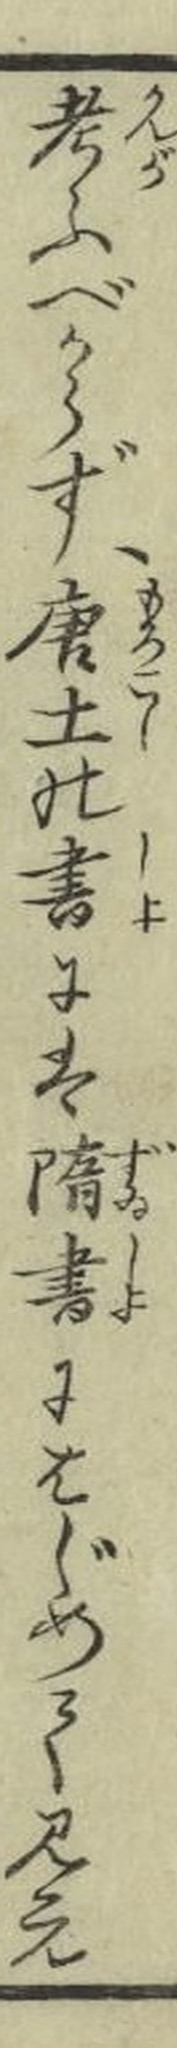考ふべからず、唐土の書には隋書にはじめて見え
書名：琉球入貢紀略
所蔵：University of the Ryukyus Library
